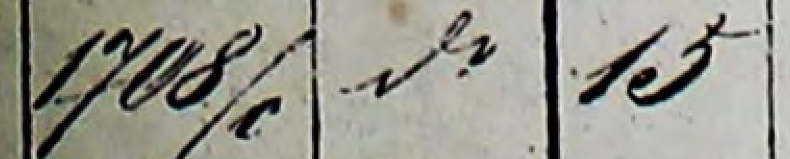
1708/c do15
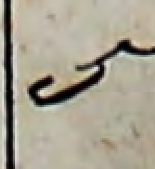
5
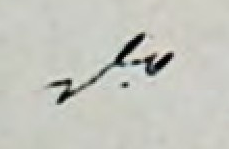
do
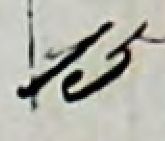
15
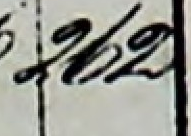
262
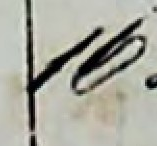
16
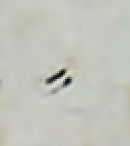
„
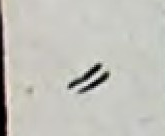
„
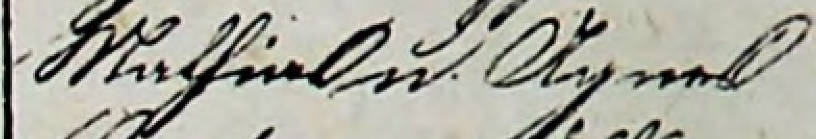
Mathias u. Agnes
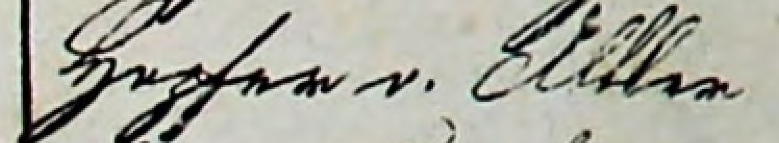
Hopfer v. Altler
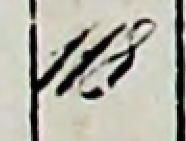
118
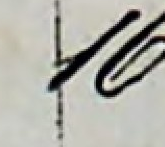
16
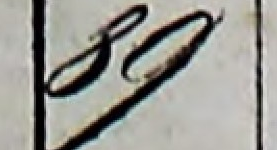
./.
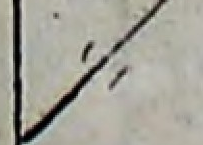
89
